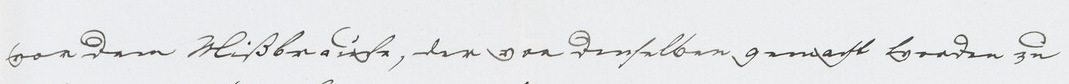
vor dem Mißbrauche, der von denselben gemacht worden zu
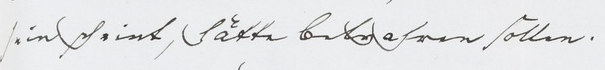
sein scheint, hätte bewahren sollen.
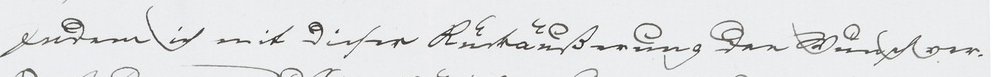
Indem ich mit dieser Rückäußerung den Wunsch ver-
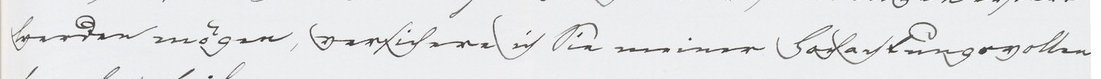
werden mögen, versichere ich Sie meiner Hochachtungsvollen
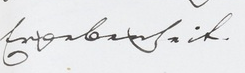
Ergebenheit.
